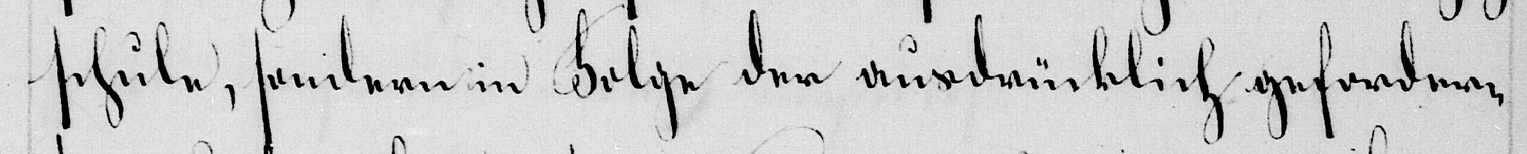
schule, sondern in Folge der ausdrücklich geforder¬
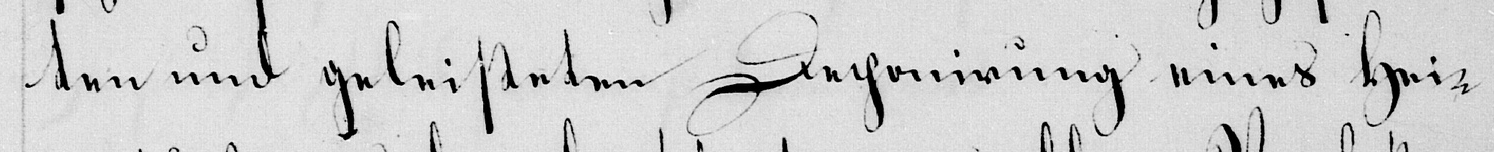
ten und geleisteten Deponirung eines Hei¬
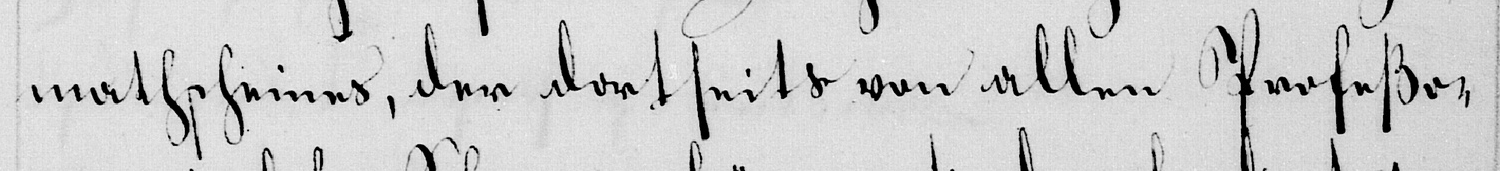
mathscheins, der dortseits von allen Profeßo¬
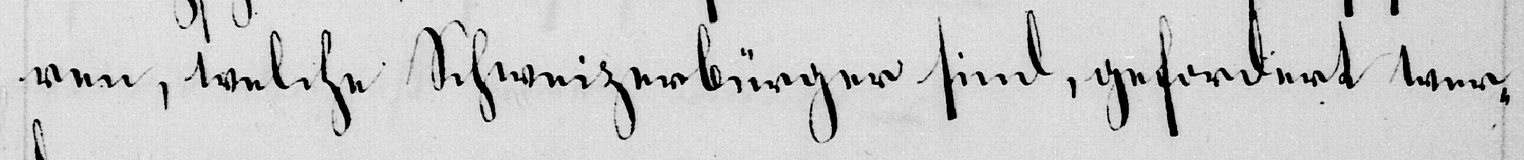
ren, welche Schweizerbürger sind, gefordert wer¬
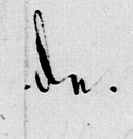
de.
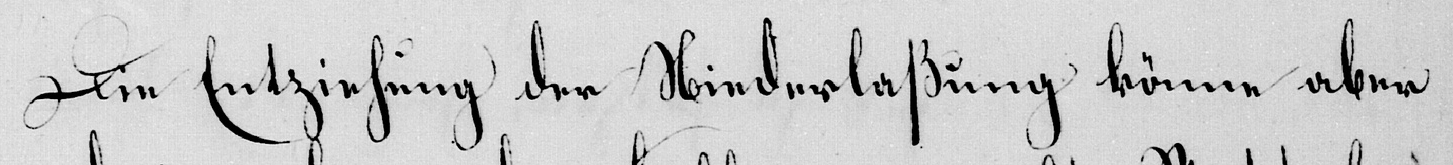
Die Entziehung der Niederlaßung könne aber
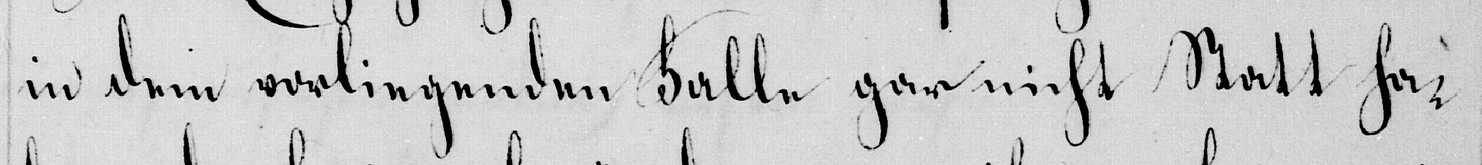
in dem vorliegenden Falle gar nicht Statt ha¬
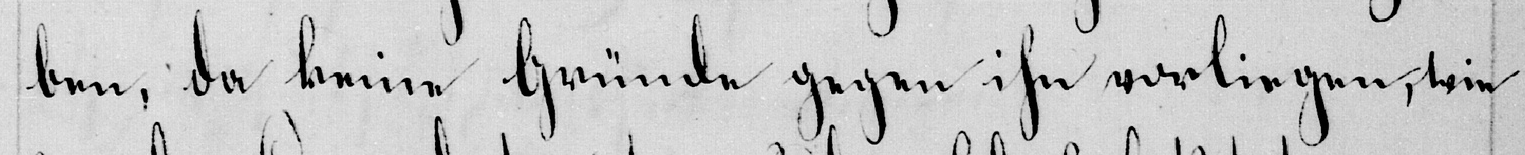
ben, da keine Gründe gegen ihn vorliegen, wie
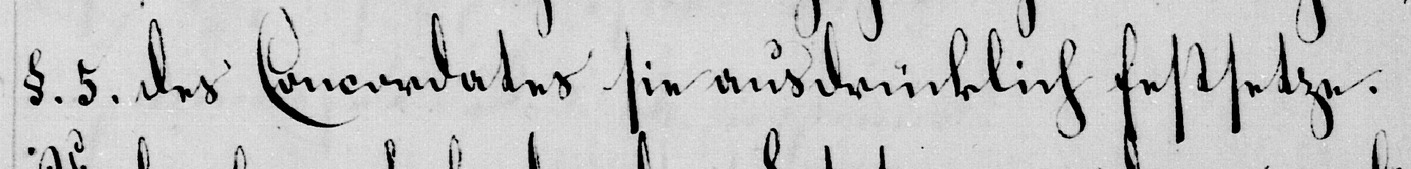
§. 5. des Concordates sie ausdrücklich festsetze.
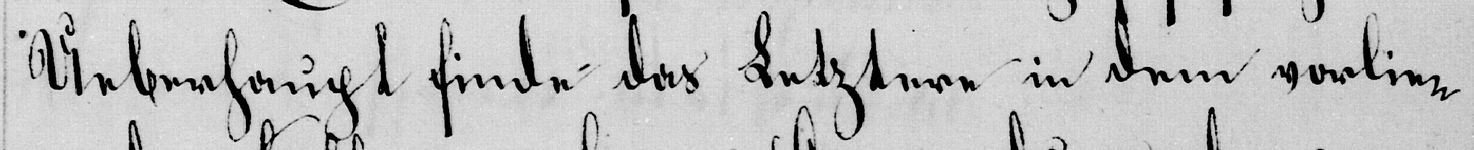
Ueberhaupt finde das Letztere in dem vorlie¬
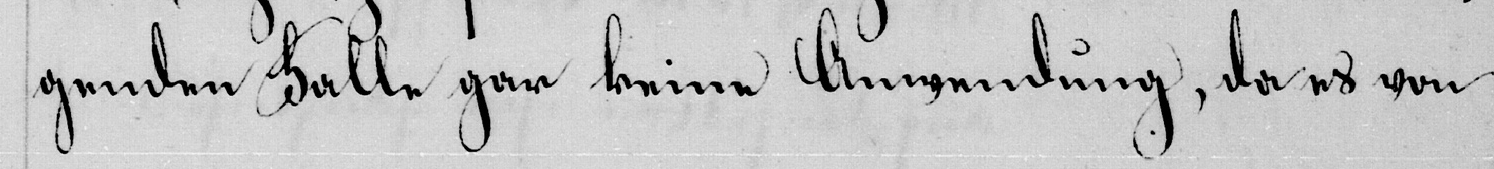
genden Falle gar keine Anwendung, da es von
